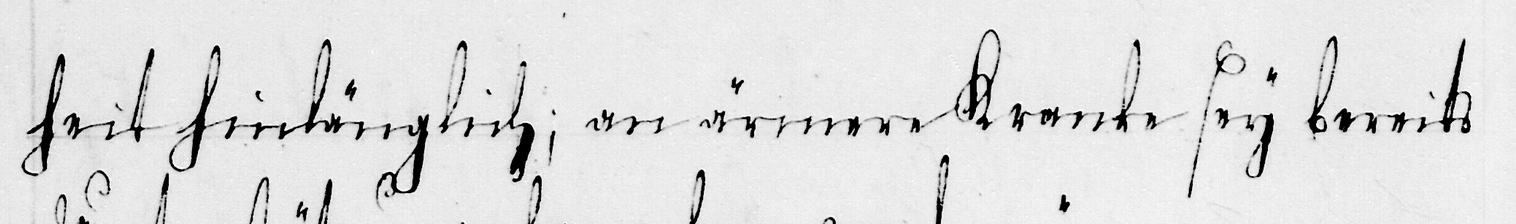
heit hinlänglich; an ärmere Kranke sey bereits
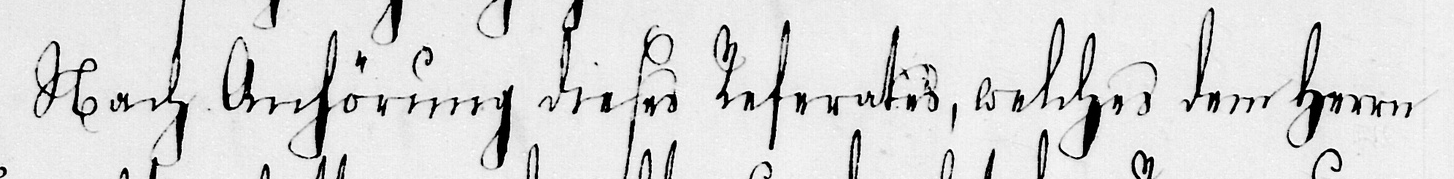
Nach Anhörung dieses Referates, welches dem Herrn
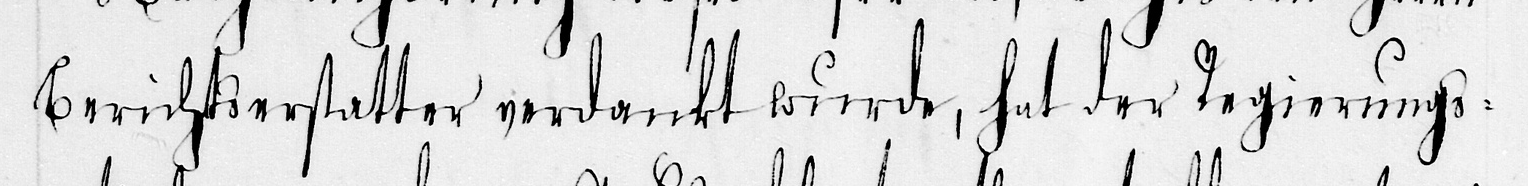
Berichtserstatter verdankt wurde, hat der Regierungs¬
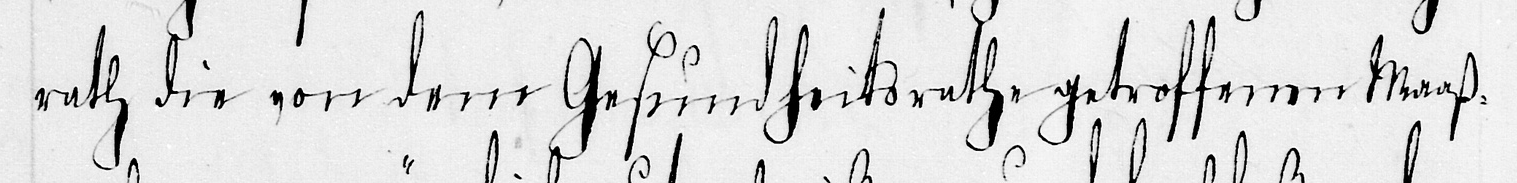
rath die von dem Gesundheitsrathe getroffenen Maaß¬
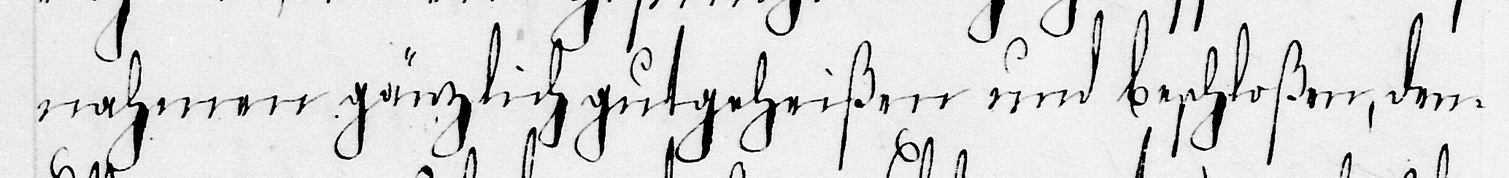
nahmen gänzlich gutgeheißen und beschloßen, den¬
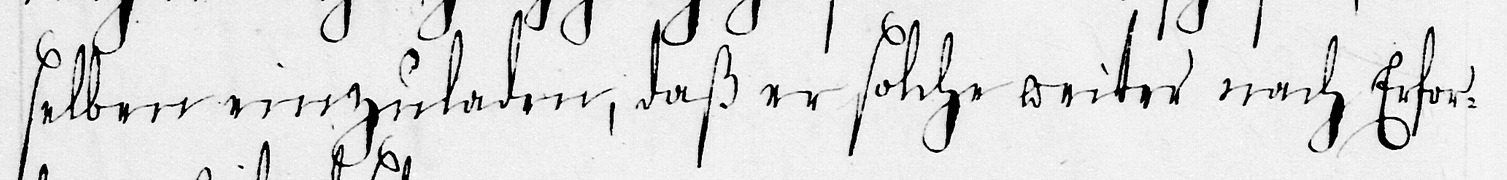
selben einzuladen, daß er solche weiter nach Erfor¬
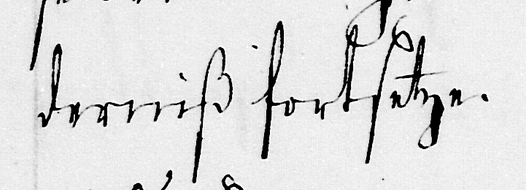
derniß fortsetze.
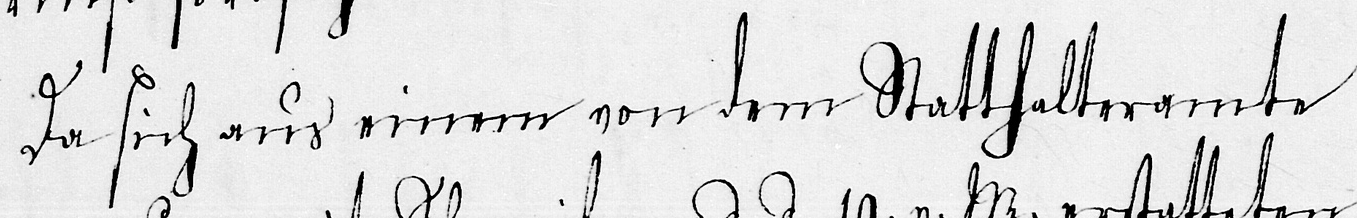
Da sich aus einem von dem Statthalteramte
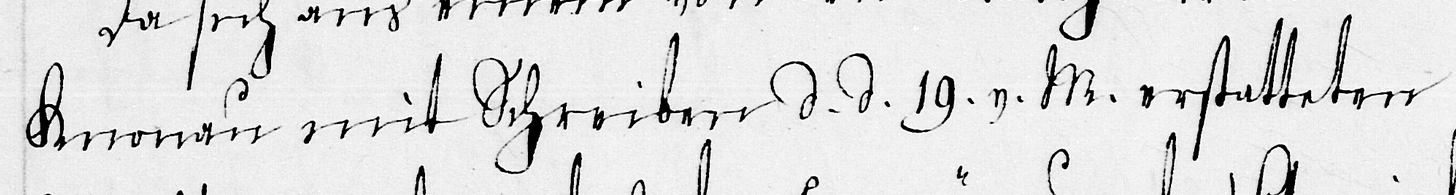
Knonau mit Schreiben d. d. 19. v. M. erstatteten
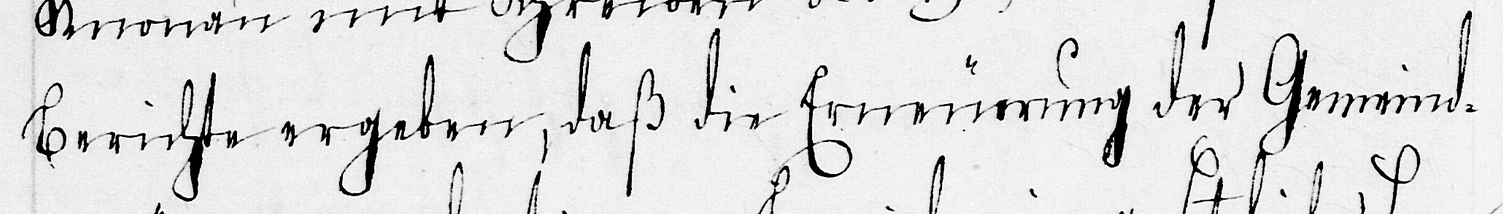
Berichte ergeben, daß die Erneuerung der Gemeind¬
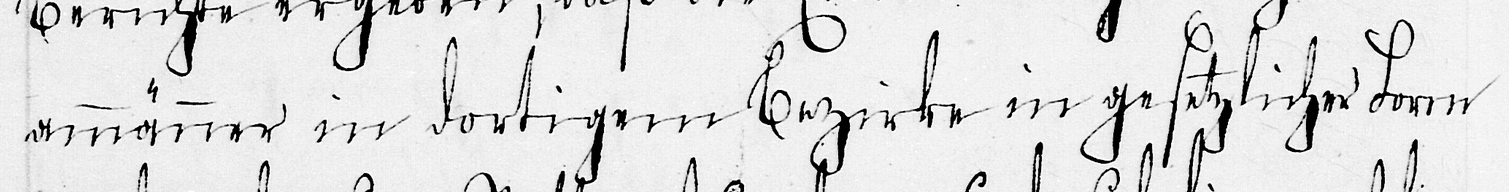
ammänner in dortigem Bezirke in gesetzlicher Form
